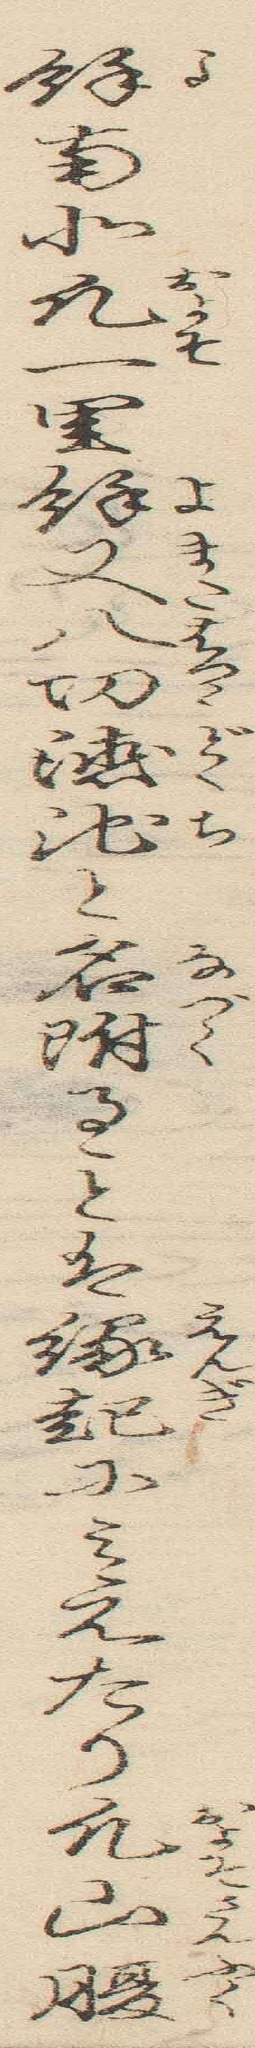餘南北凢一里餘又八功徳池と名附ることは縁起にみえたり凢山腹
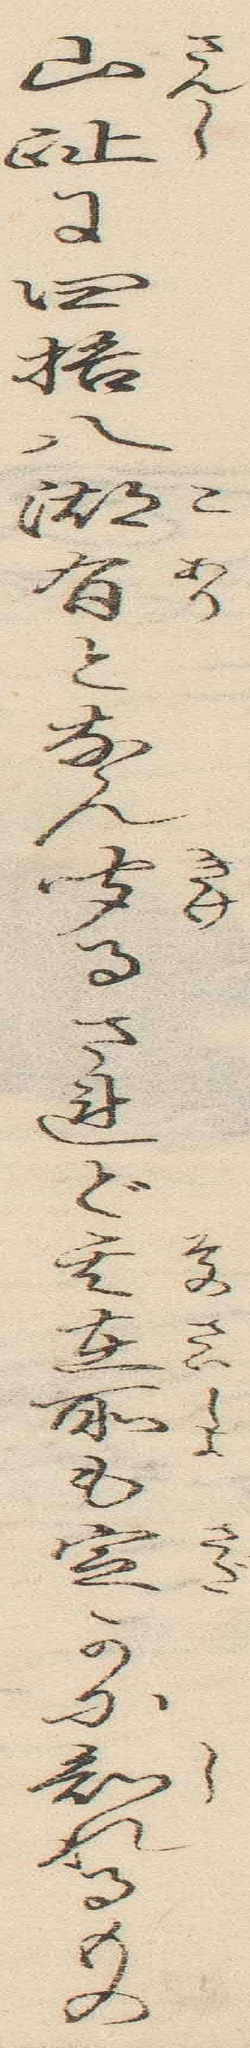山趾に四拾八湖有となん聞るされど其在所も定かに知れるもの
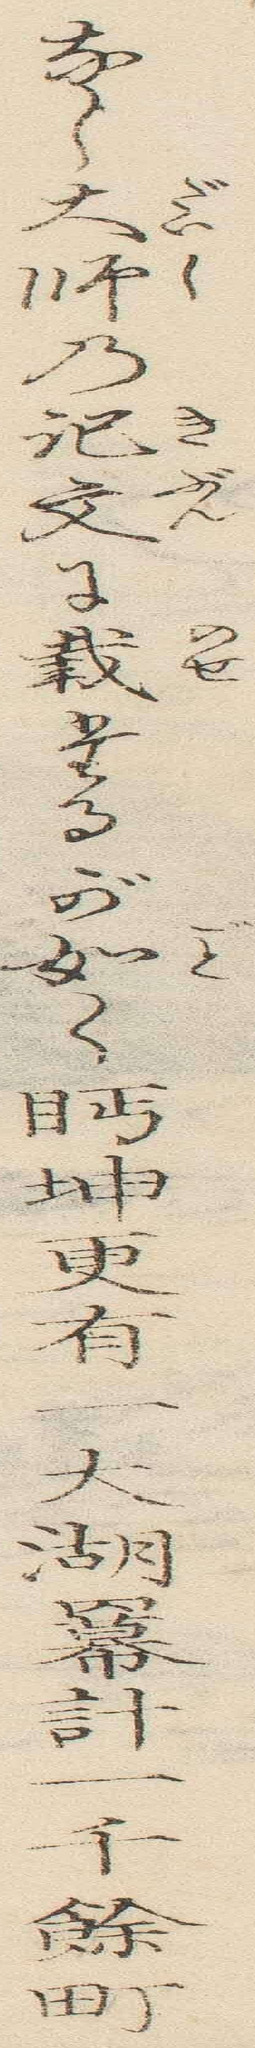なし大師の記文に載たるが如く眄坤更有一大湖羃計一千餘町
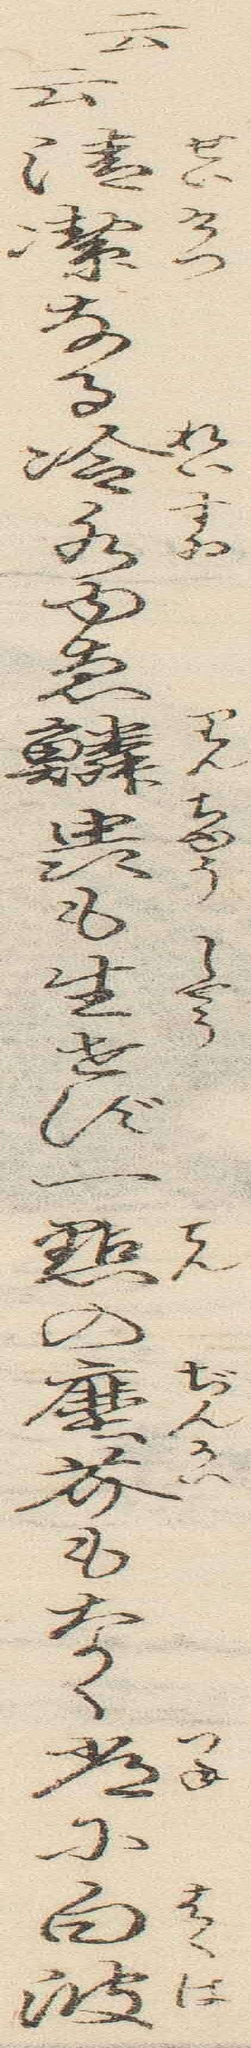云云清潔なる冷水ゆゑ鱗蟲も生せず一㸃の塵芥もなく常に白波
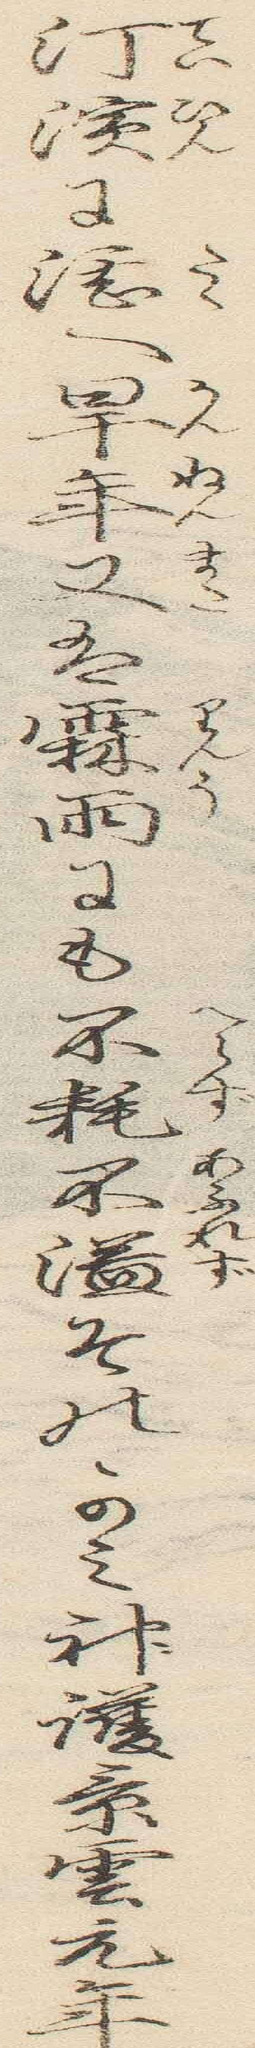汀濱に湛へ旱年又は霖雨にも不耗不溢そのかみ神護景雲元年
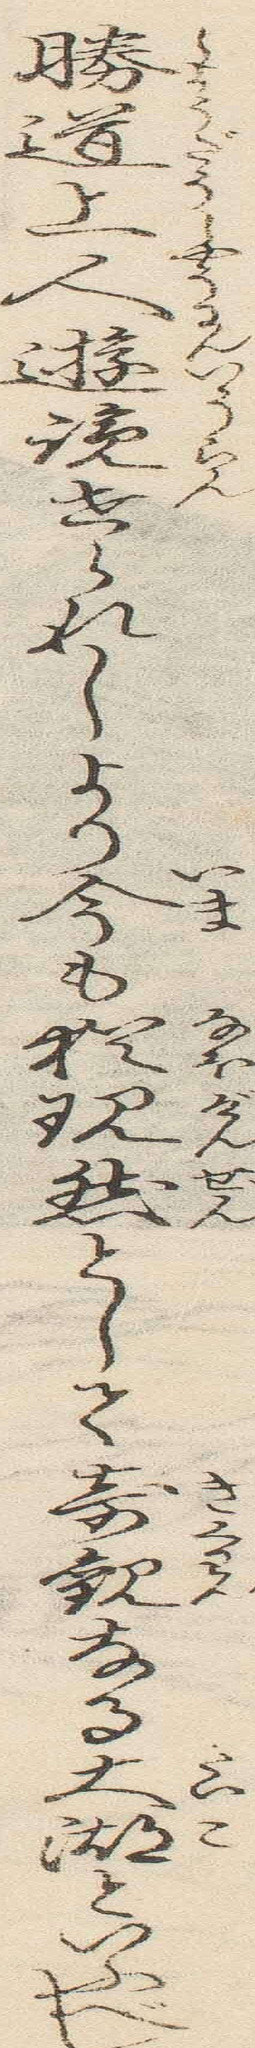勝道上人㳺覧せられしより今も猶現然として竒觀なる大湖といふべし
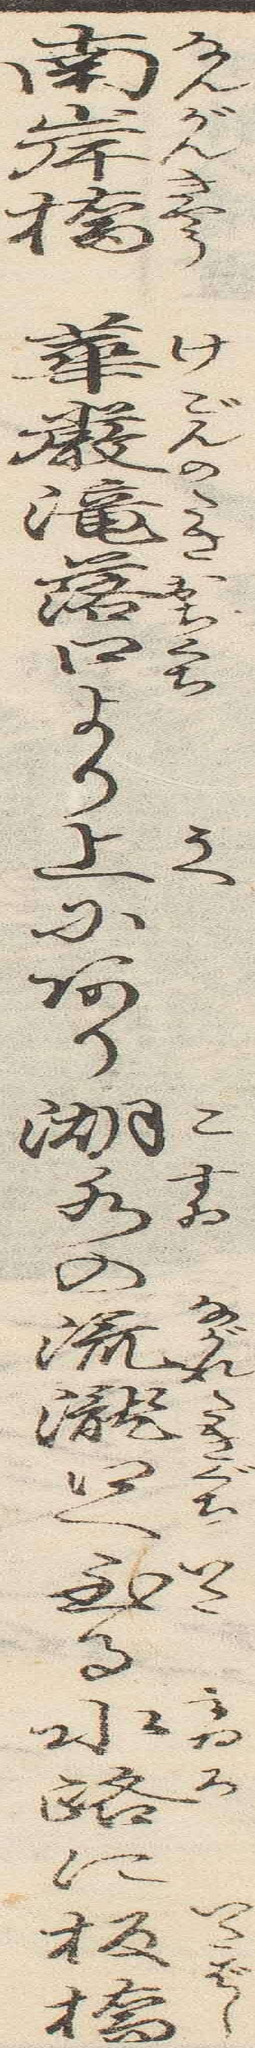南岸橋蕐嚴滝落口より上にあり湖水の流瀧口へ至る水路に板橋
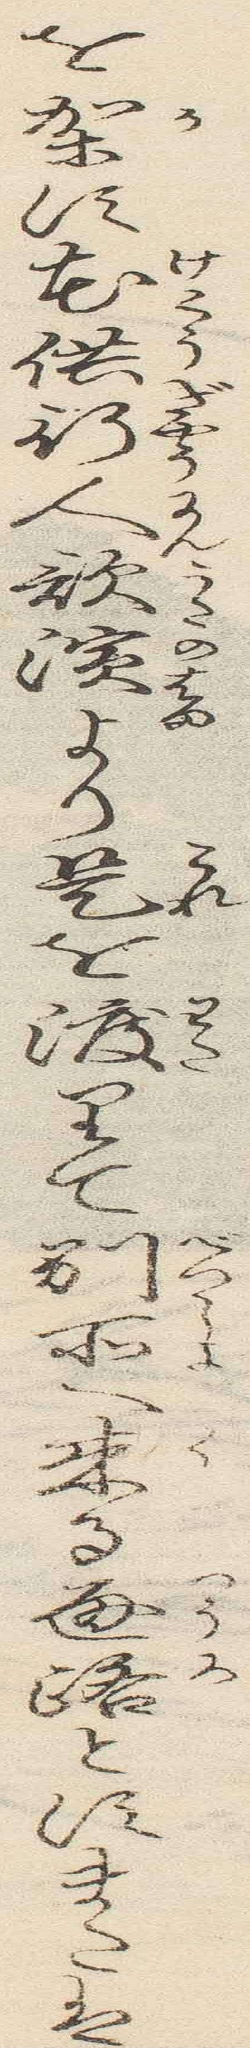を架す花供行人歌濱より是を渡りて別所へ來る通路とすまたは
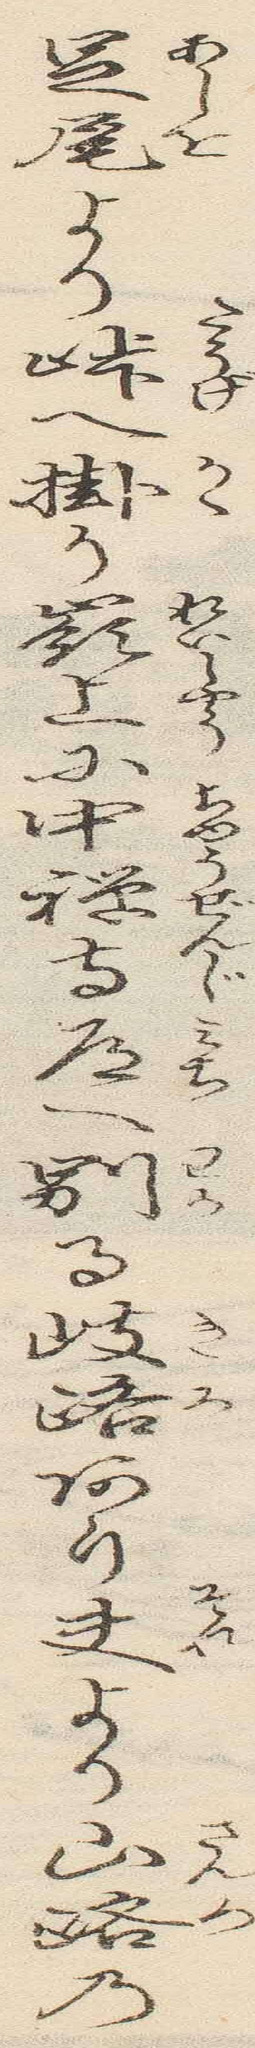足尾より峠へ掛り嶺上に中禅寺道へ別る岐路あり夫より山路の
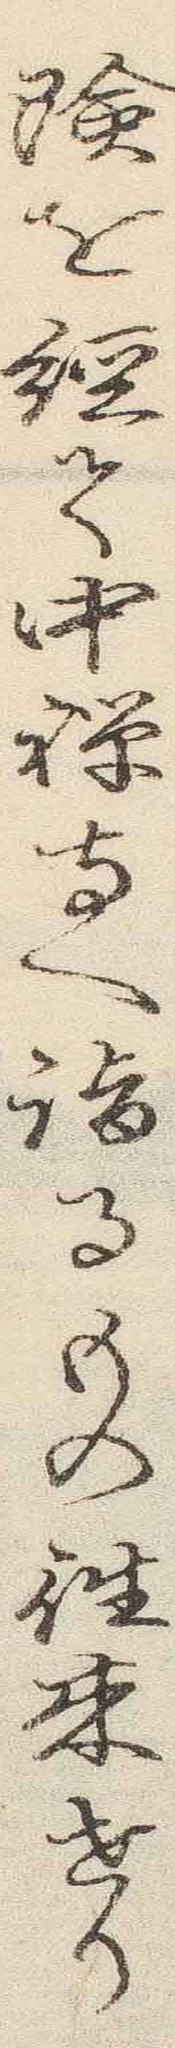険を經て中禅寺へ詣るもの徃來せり
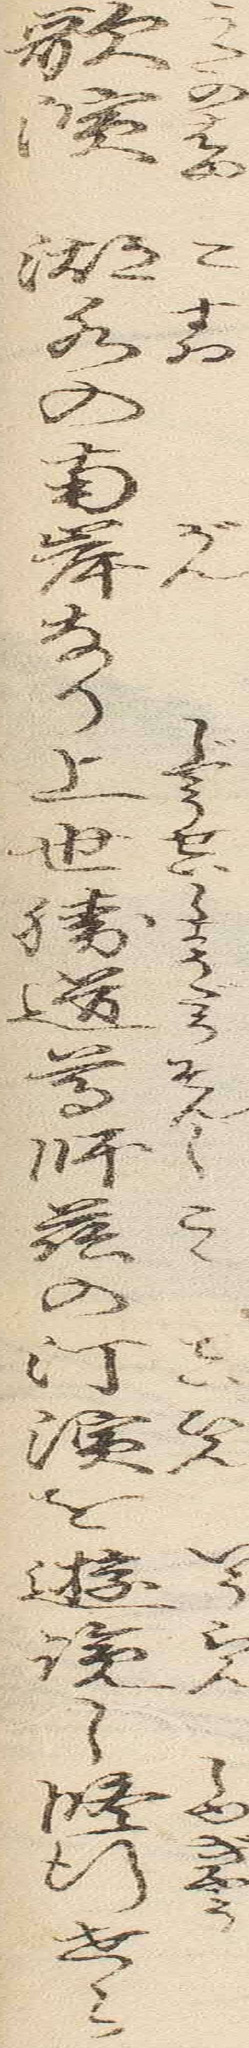歌濱湖水の南岸なり上世勝道尊師兹の汀濱を㳺覧し修行せら
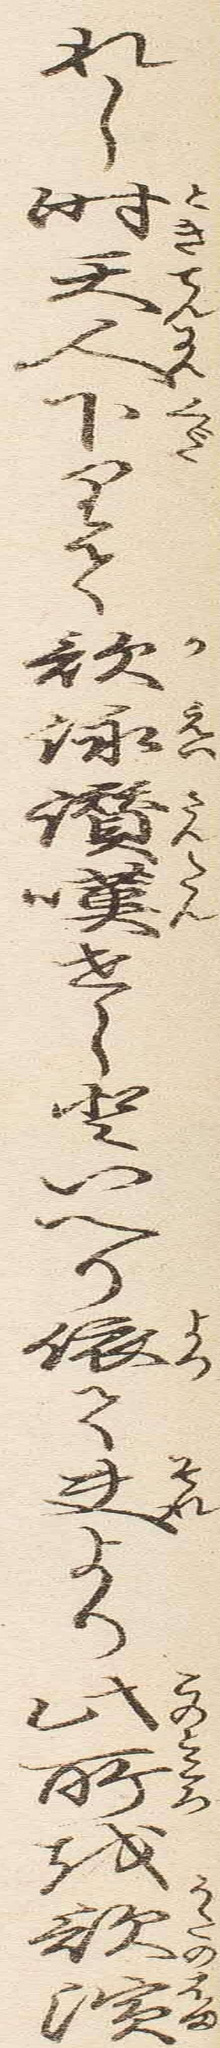れし时天人下りて歌詠讃嘆せしといへり依て夫より此所を歌濱
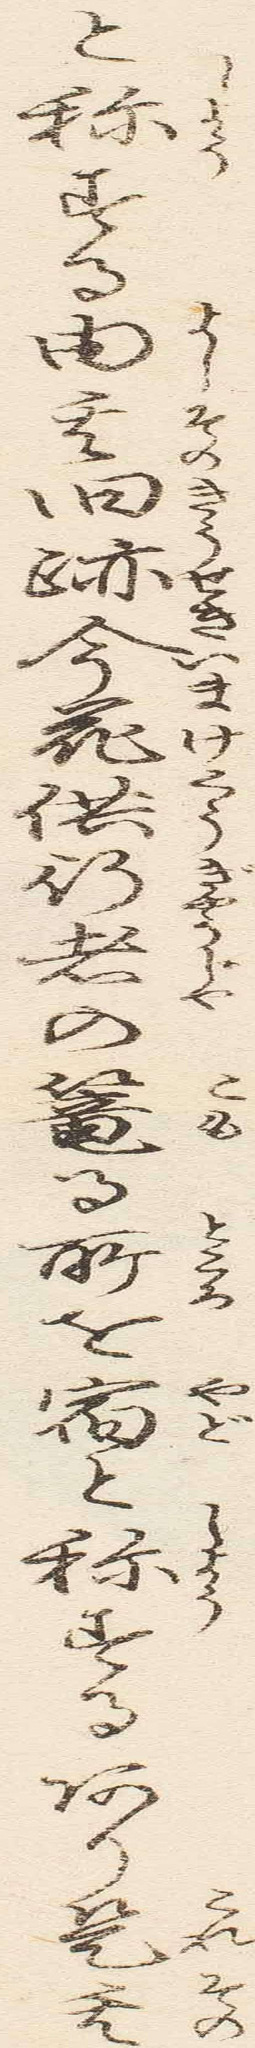と称する由其旧跡今花供行者の篭る所を宿と称するあり是其
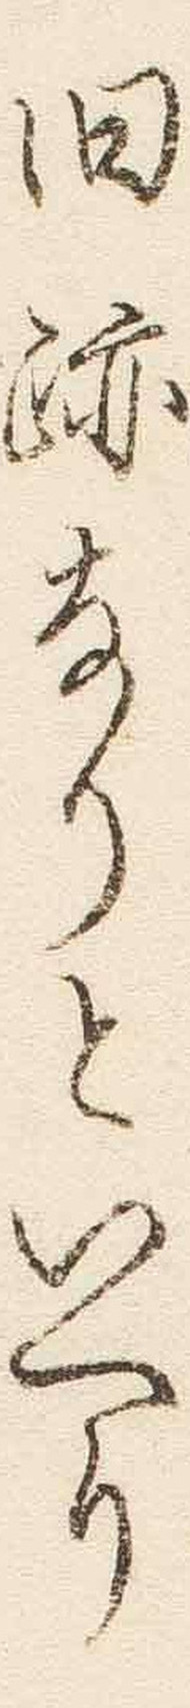旧跡なりといへり
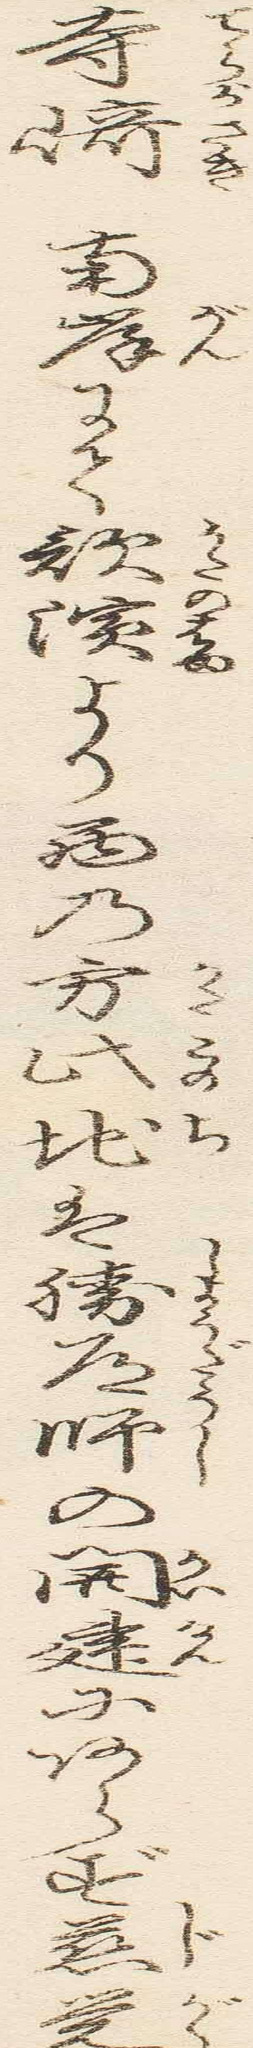寺﨑南岸にて歌濱より西の方此地は勝道師の開建にあらず慈覚
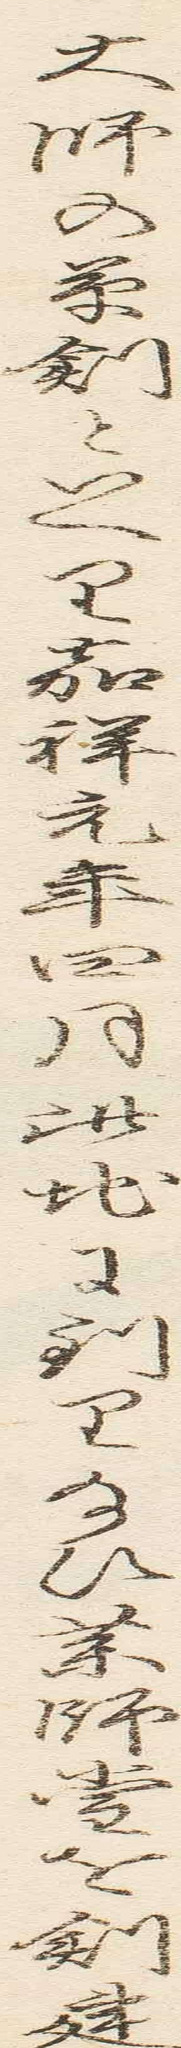大師の草創といへり嘉祥元年四月此地に到り給ひ薬師堂を創建
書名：日光山志
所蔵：東京学芸大学附属図書館 国文学研究資料館
